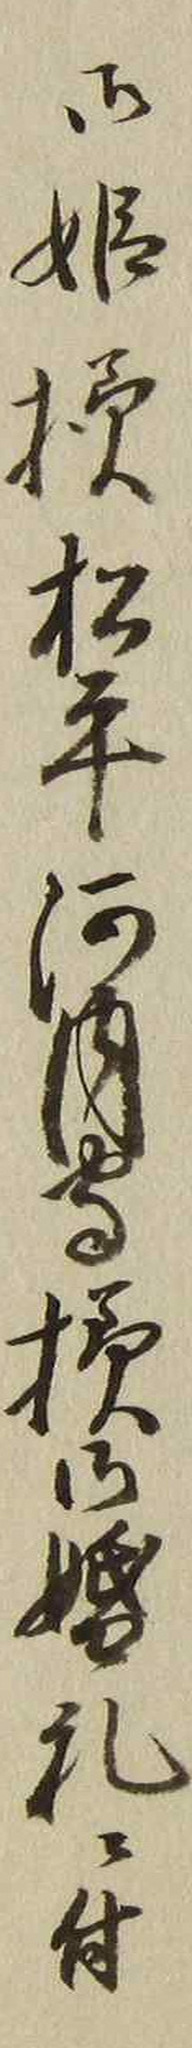御姫様松平河内守様御婚礼に付
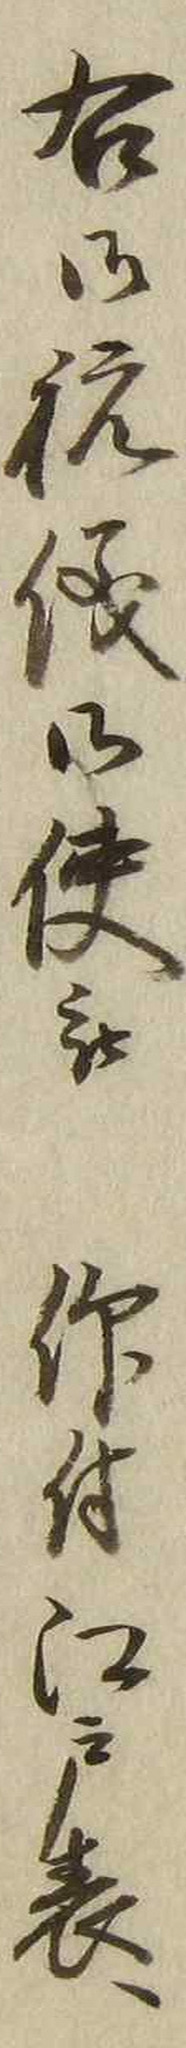右御祝儀御使被仰付江戸表へ
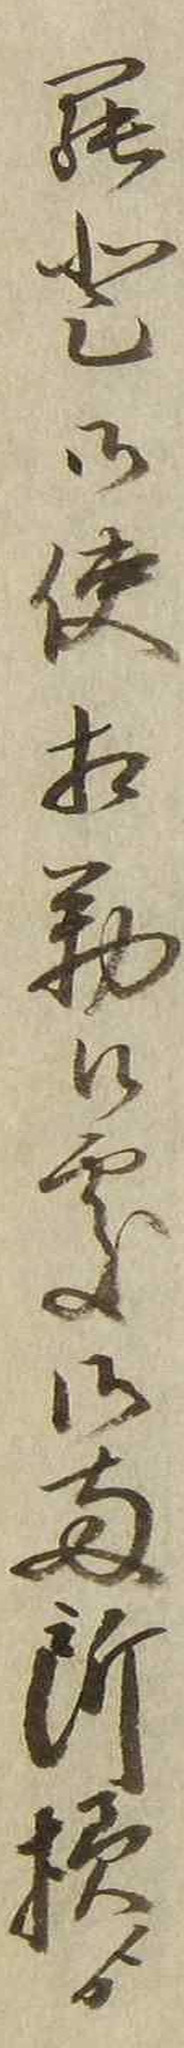罷登御使相勤候処御両所様ゟ

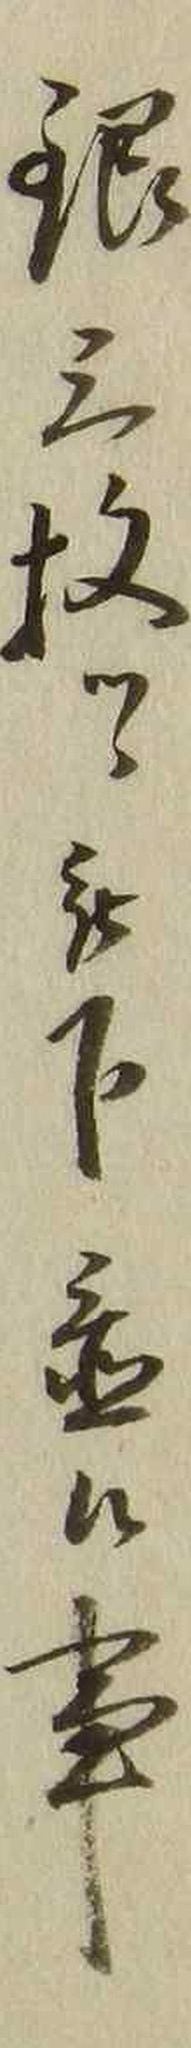銀三枚つヽ被下置候事
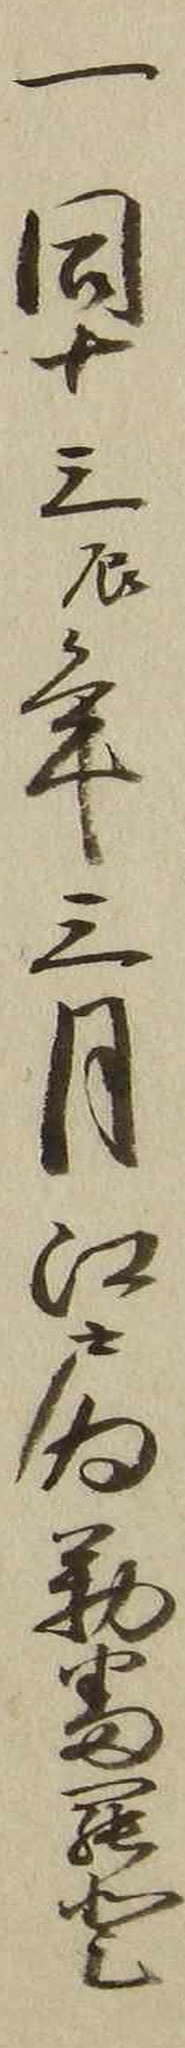一同十三辰年三月江戸為勤番罷登
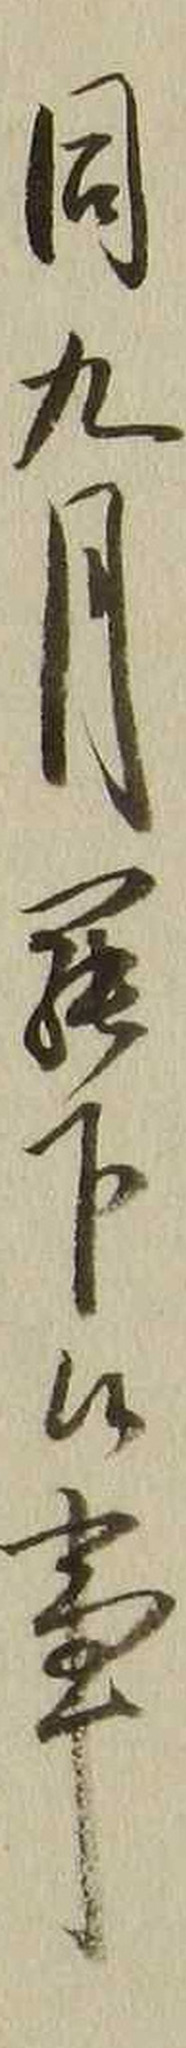同九月罷下候事
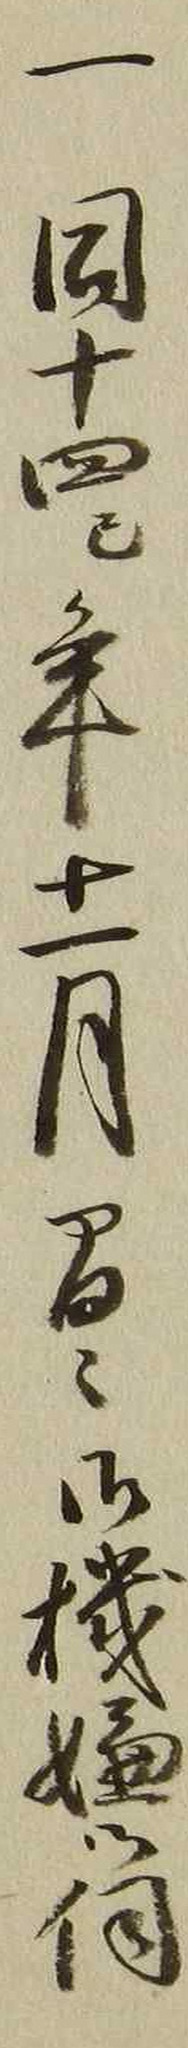一同十四巳年十一月間々御機嫌御伺
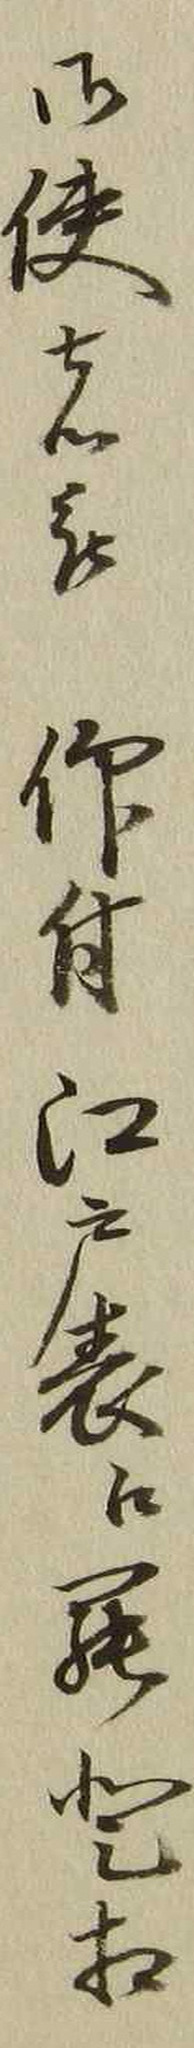御使者被仰付江戸表江罷登相
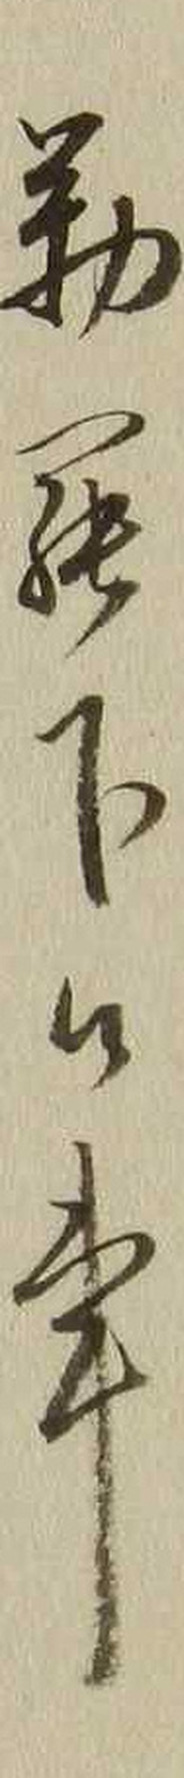勤罷下候事
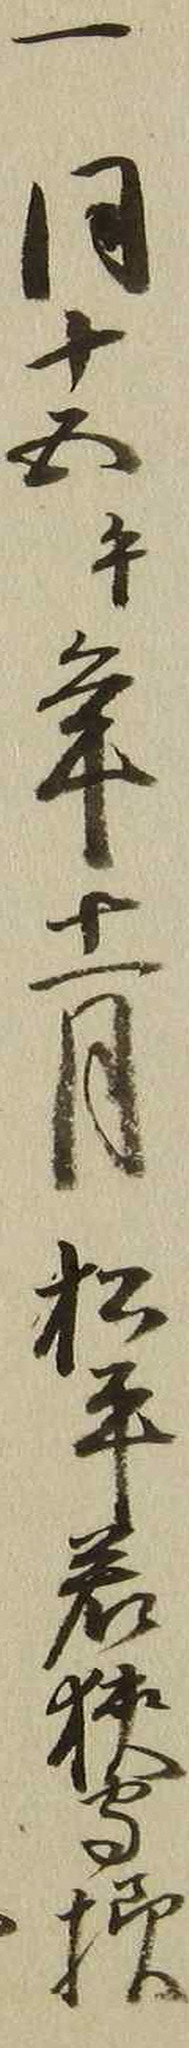一同十五午年十一月松平若狭守様
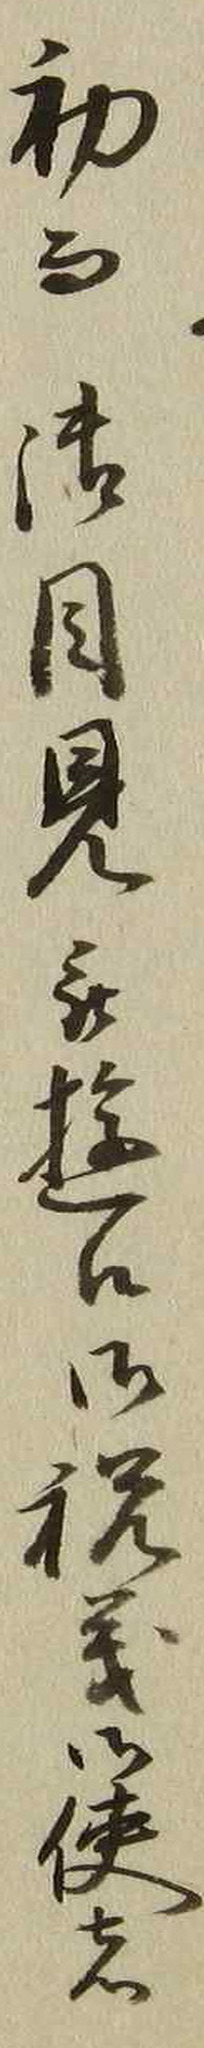初而御目見被遊候御祝義御使者
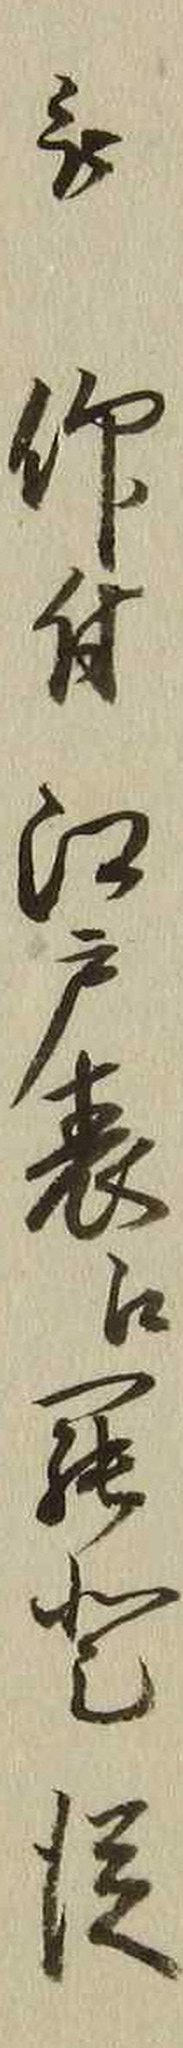被仰付江戸表江罷登従
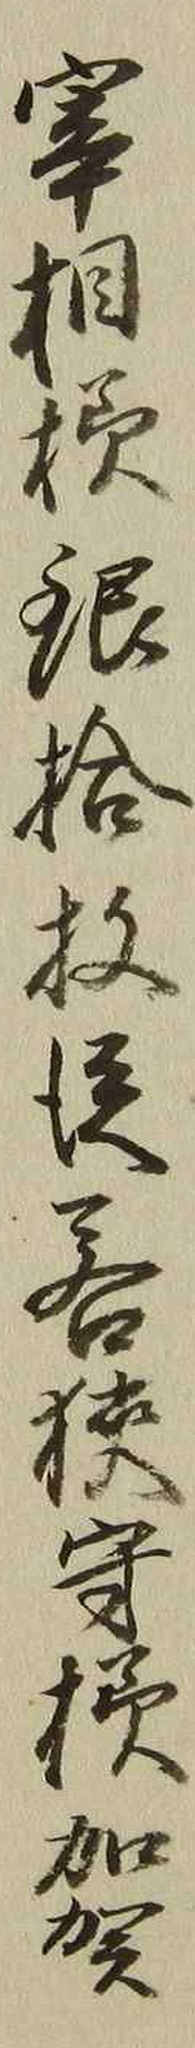宰相様銀拾枚従若狭守様加賀
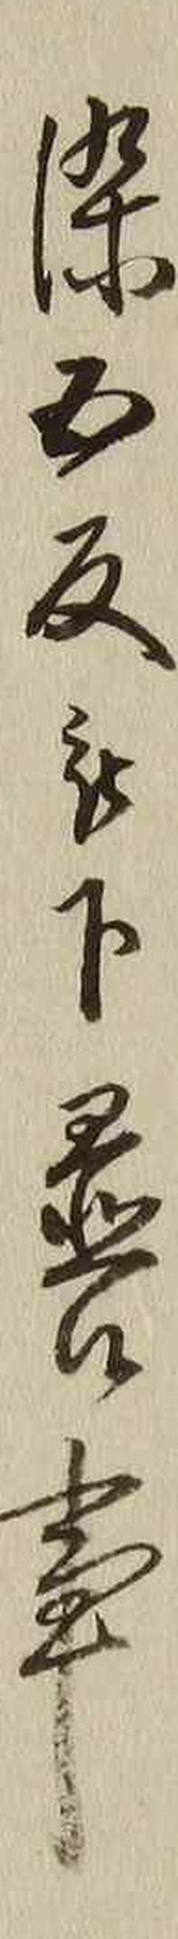染五反被下置候事
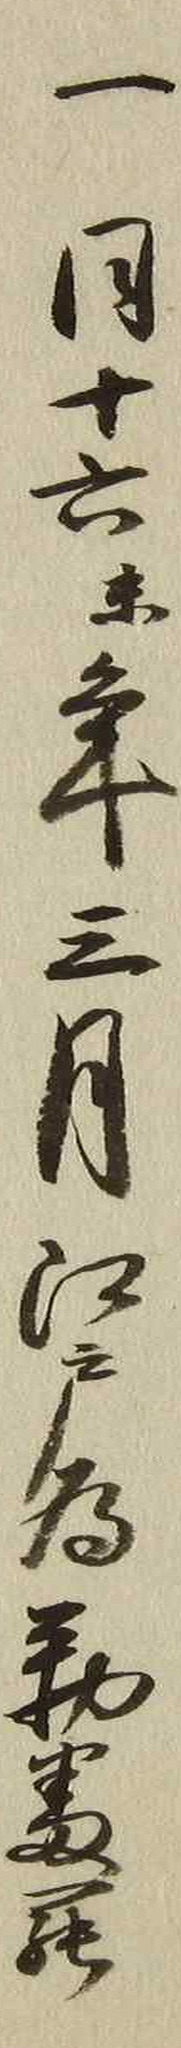一同十六末年三月江戸為勤番罷
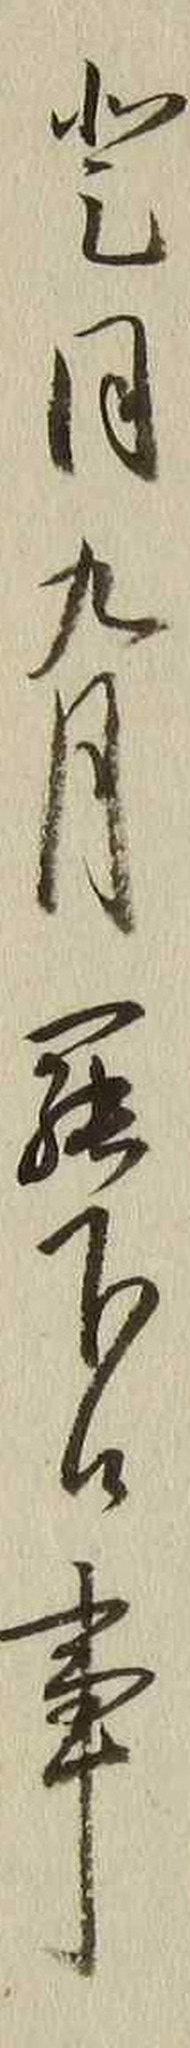登同九月罷下候事
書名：諸士系譜　巻之133　た之部9
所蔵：会津若松市立会津図書館
